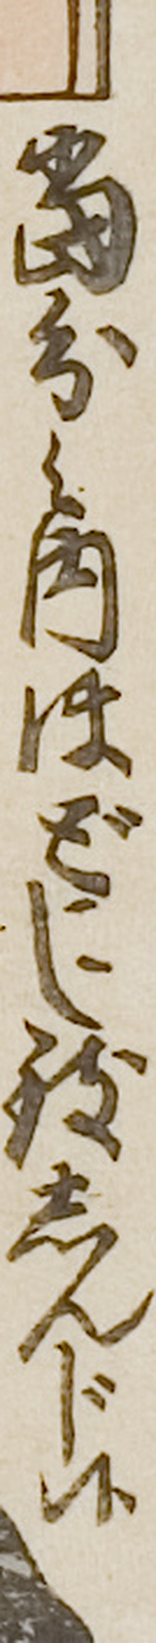当分之内ほどこし致しんじ候
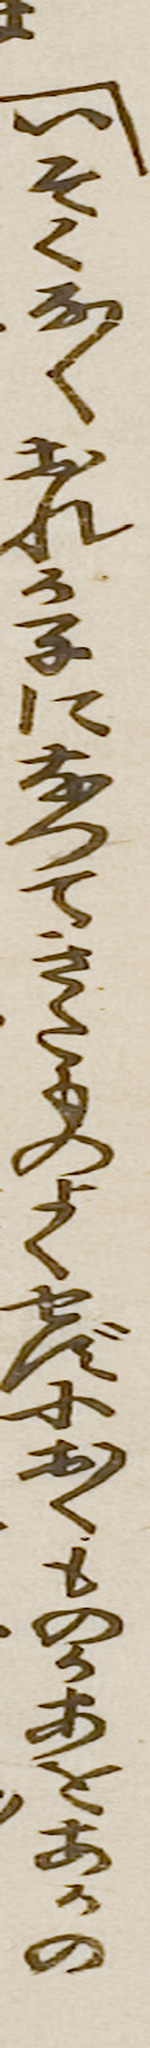ゑんま「いそくな＼おれか子になつてきたものよくせずにおくものかあをあかの
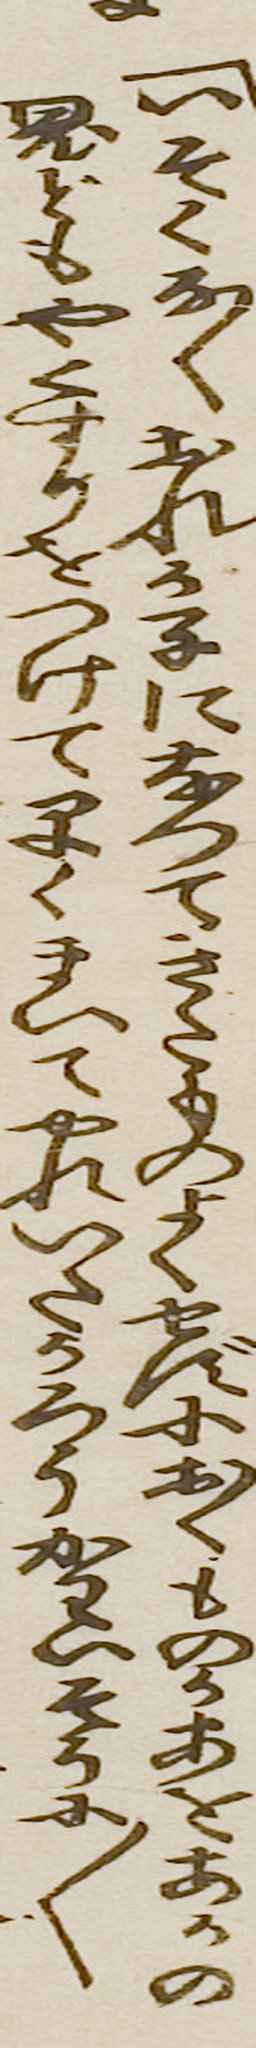鬼どもやくすりをつけて早々まいてやれいたかろうかわいそうに＼
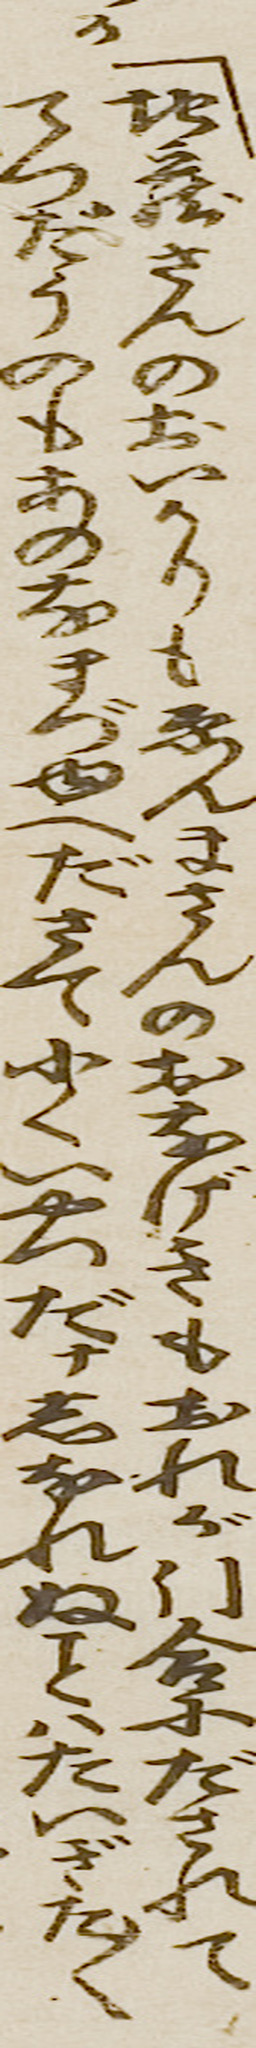てつだうのもあのなまづゆへださてにくいやつだナしなれぬことはたいぎた＼
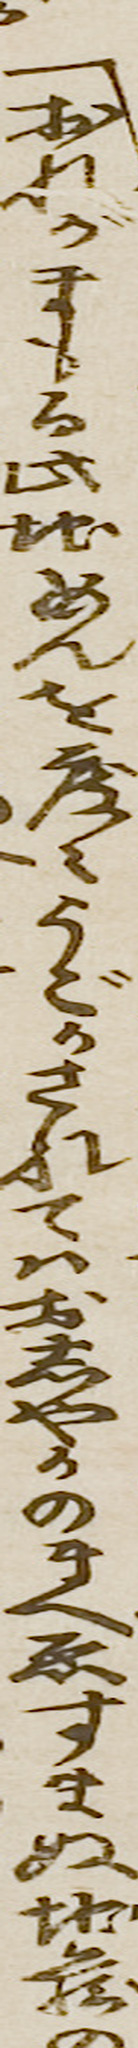地蔵「おれがまもる此地めんを度々うごかされてはおしやかのまへゑすまぬ地蔵の
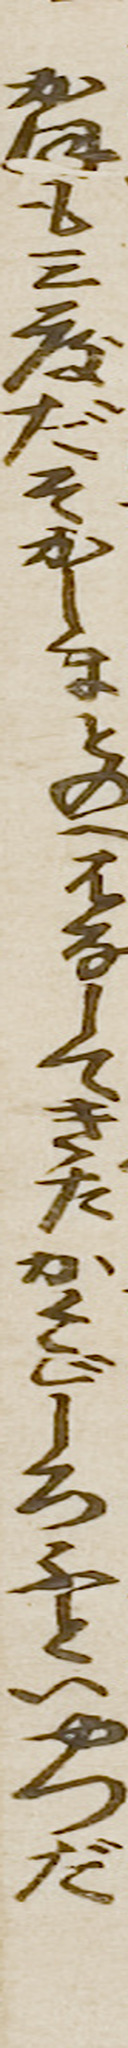かほも三度だそかしまとのへはなしてきたかくごしろふといやつだ
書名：うち身くじきりやうじ所
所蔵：東京大学総合図書館 General Library in the University of Tokyo, JAPAN
